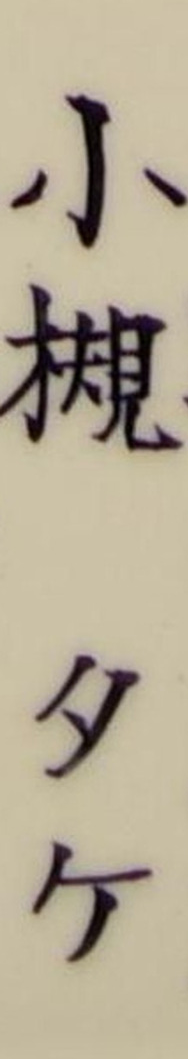小槻タケ
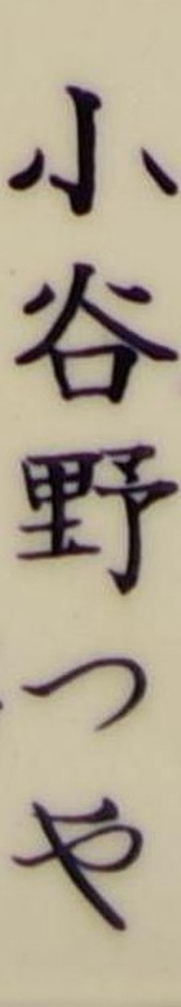小谷野つや
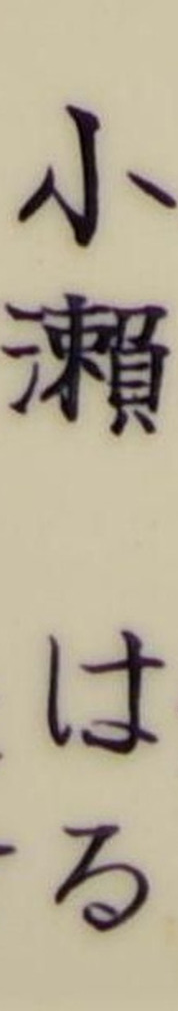小頼はる
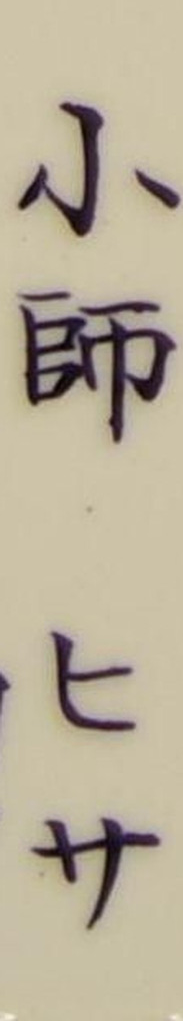小師ヒサ
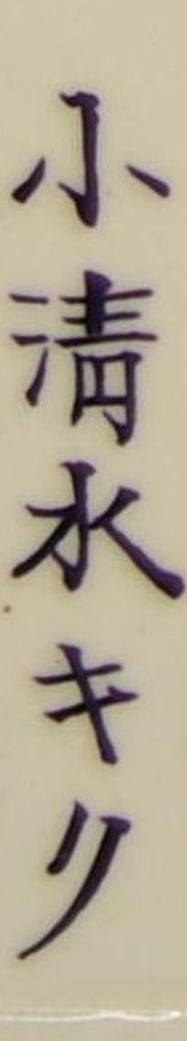小清水キク
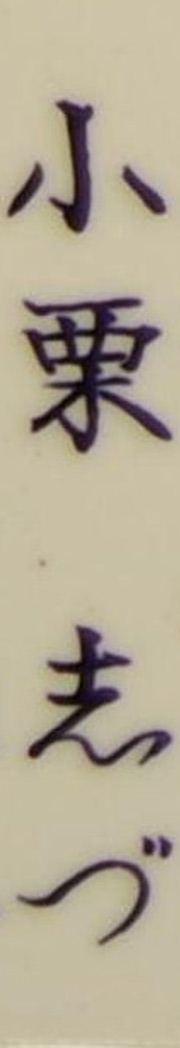小栗しづ
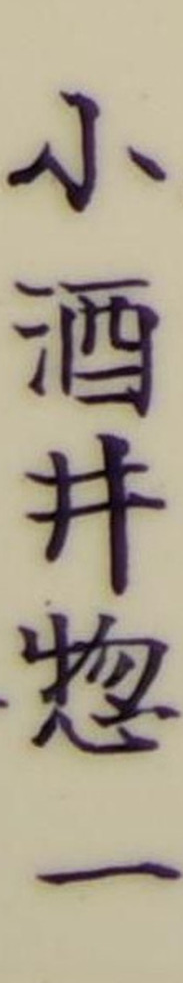小酒井惣一

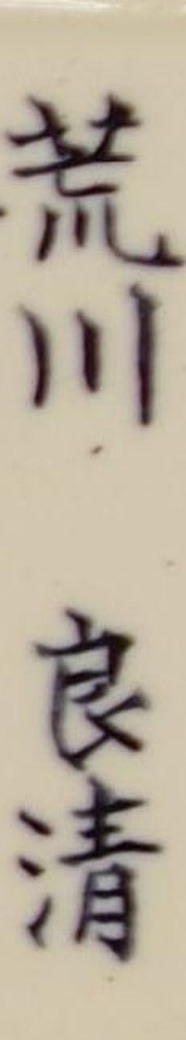荒川良清
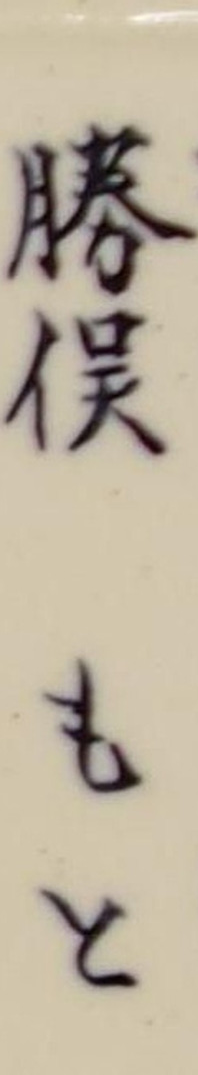勝俣もと
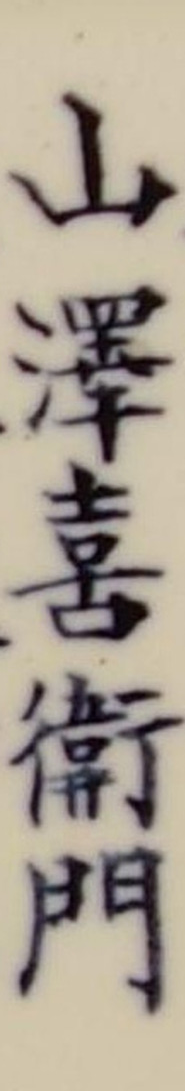山澤喜衛門
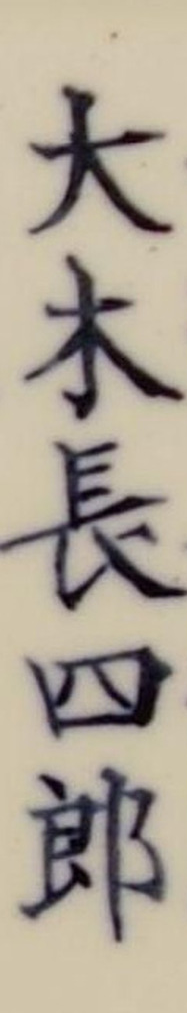大木長四郎
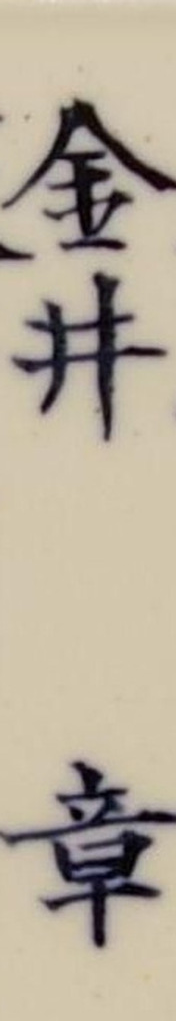金井章
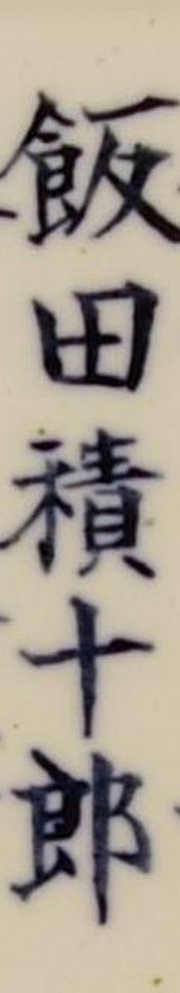飯田積十郎
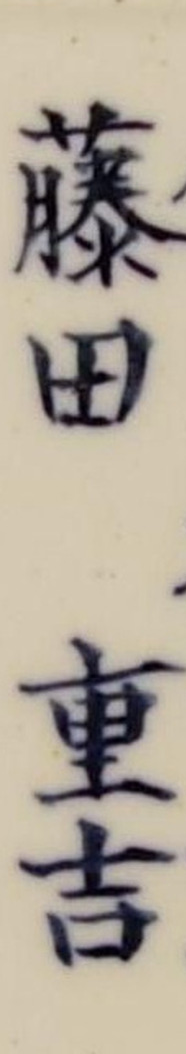藤田重吉
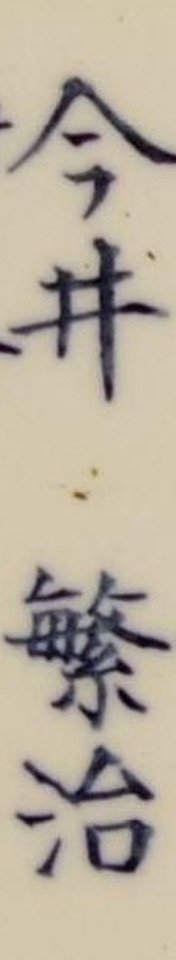今井繁治
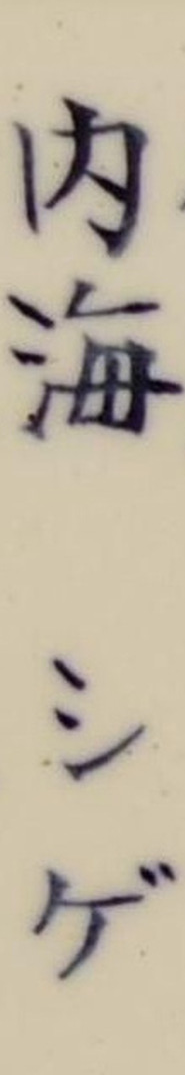内海シゲ
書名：E~L
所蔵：高野山金剛峯寺
